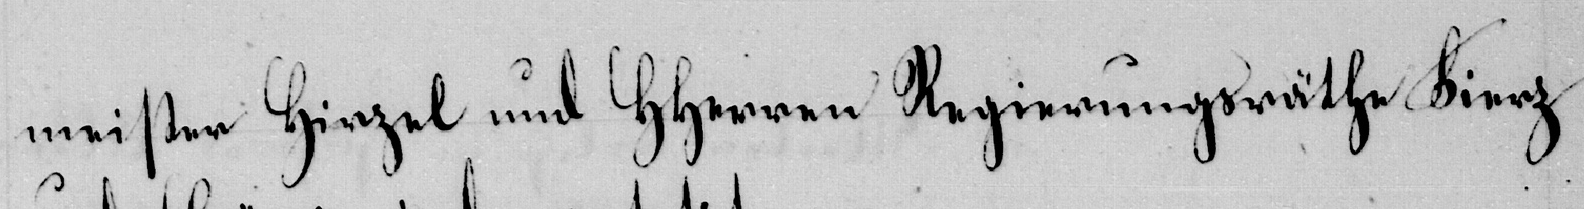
meister Hirzel und HHerren Regierungsräthe Fierz
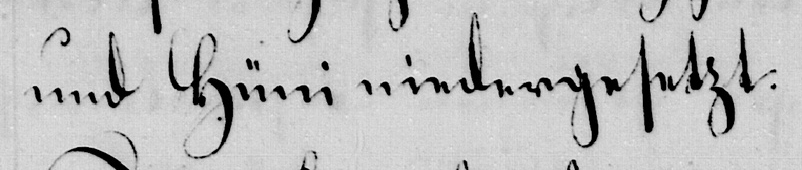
und Hüni niedergesetzt.
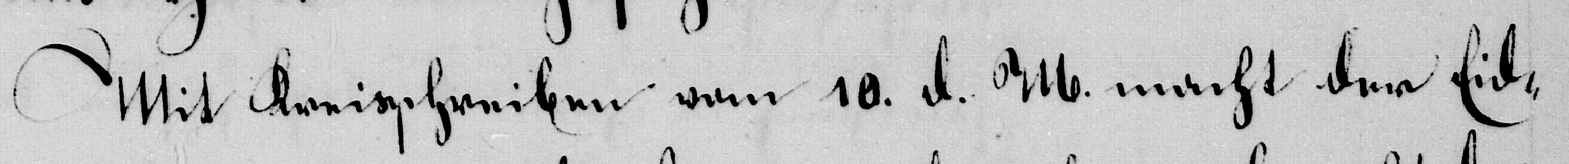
Mit Kreisschreiben vom 10. d. M. macht der Eid¬
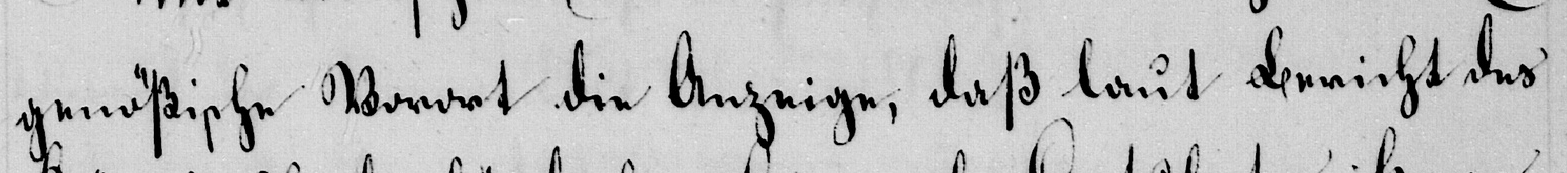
genößische Vorort die Anzeige, daß laut Bericht des
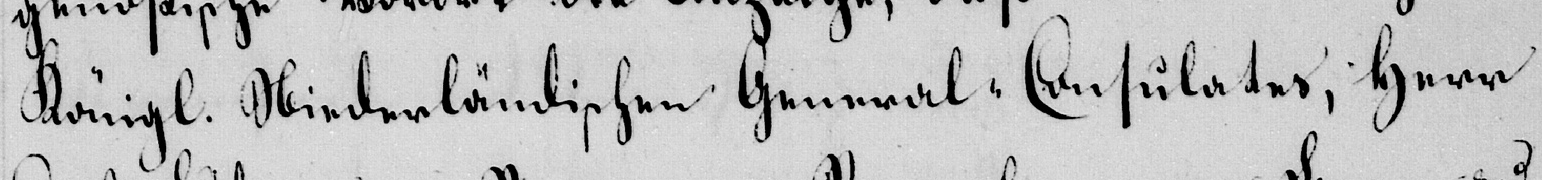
Königl. Niederländischen General-Consulates, Herr
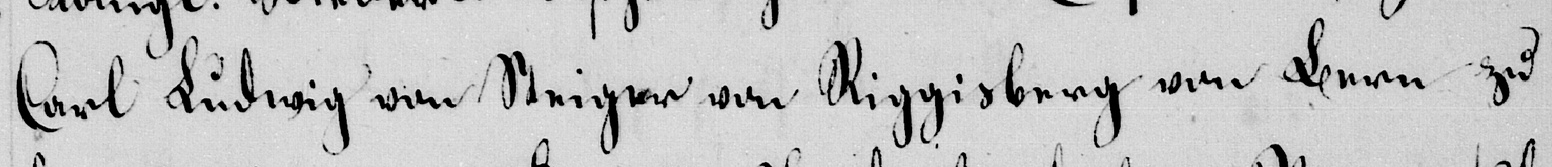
Carl Ludwig von Steiger von Riggisberg von Bern zu
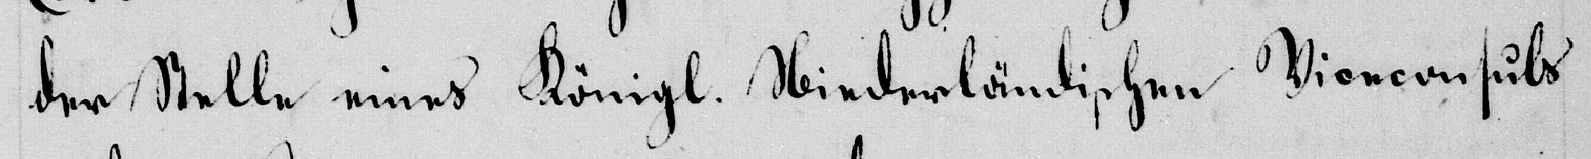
der Stelle eines Königl. Niederländischen Viceconsuls
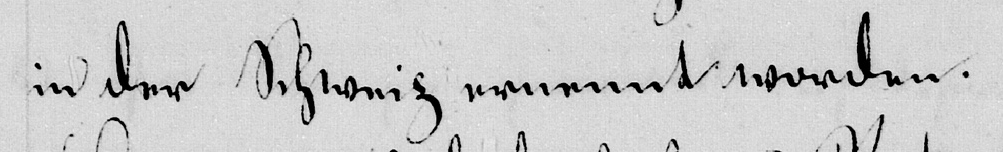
in der Schweiz ernennt worden.
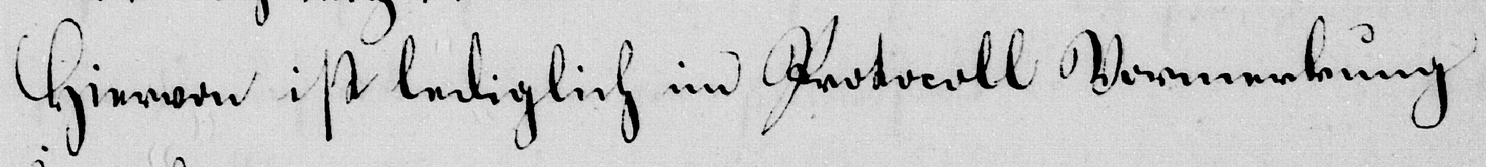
Hiervon ist lediglich im Protokoll Vormerkung
